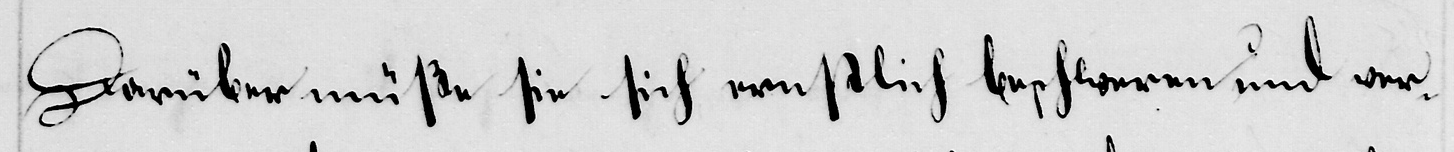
Darüber müße sie sich ernstlich beschweren und ver¬
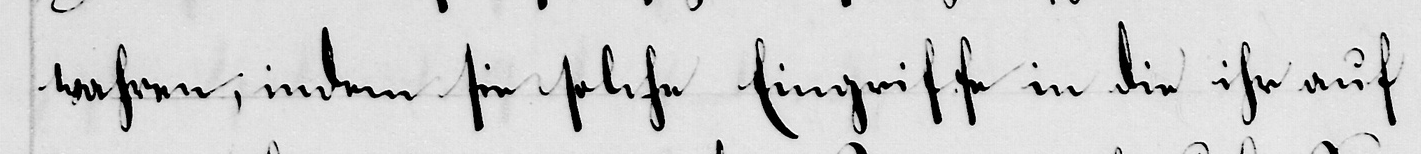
wahren, indem sie solche Eingriffe in die ihr auf
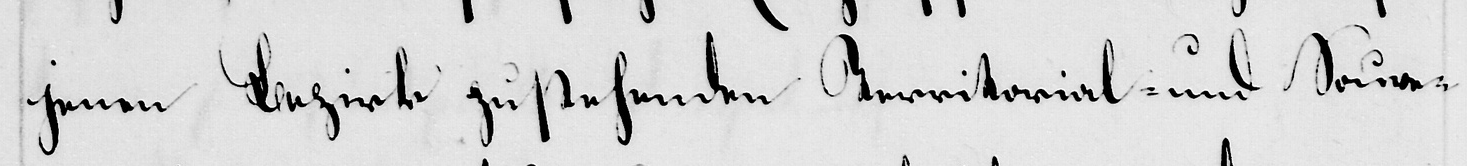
jenen Bezirk zustehenden Territorial- und Souve¬
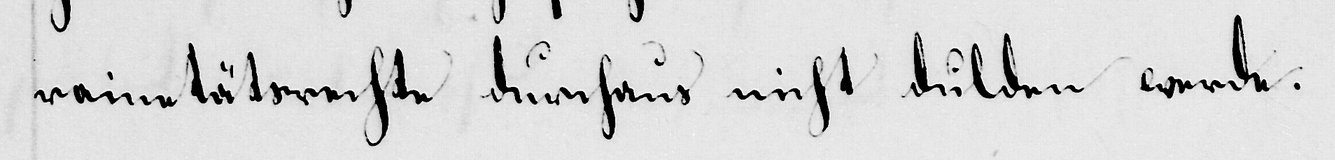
rainetätsrechte durchaus nicht dulden werde.
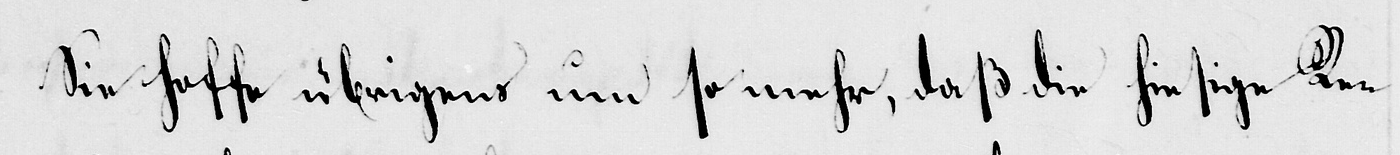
Sie hoffe übrigens um so mehr, daß die hiesige Re¬
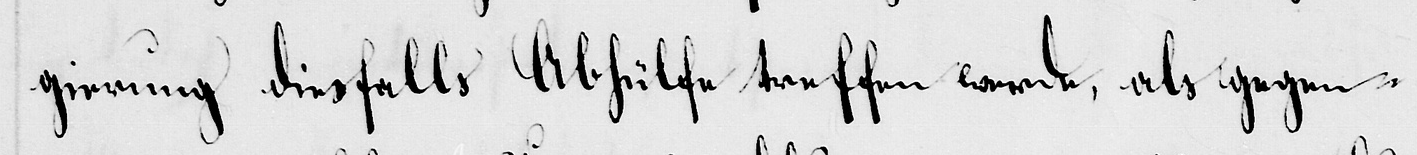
gierung diesfalls Abhülfe treffen werde, als gegen¬
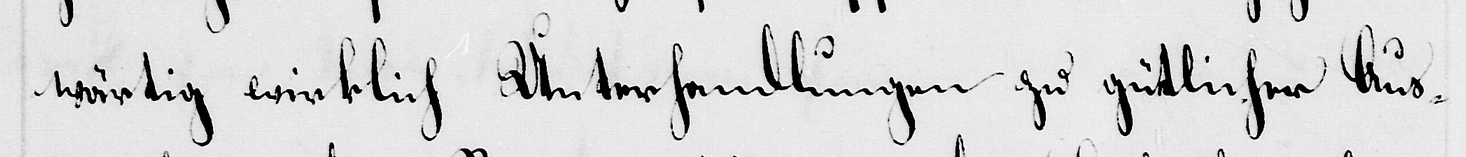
wärtig wirklich Unterhandlungen zu gütlicher Aus¬
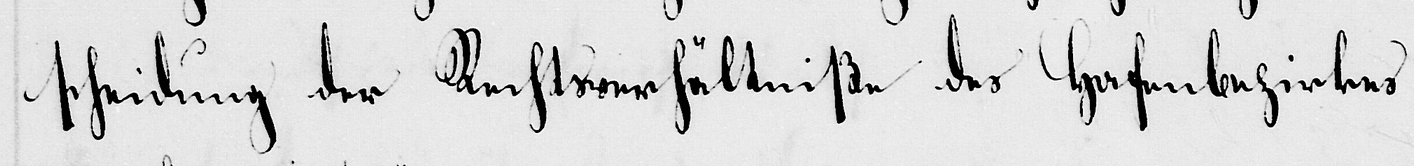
scheidung der Rechtsverhältniße des Hafenbezirkes
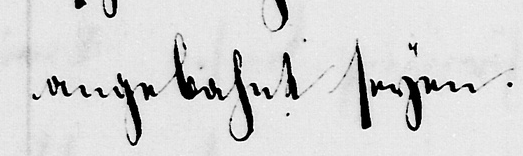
angebahnt seyen.
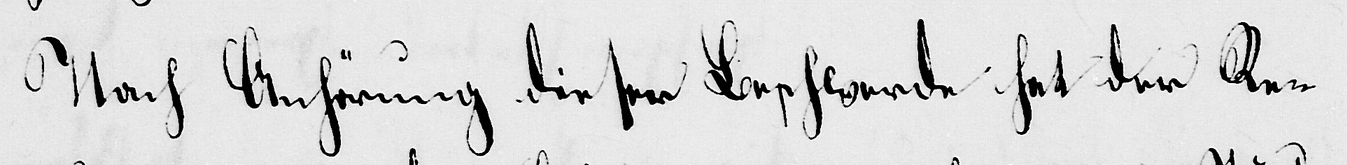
Nach Anhörung dieser Beschwerde hat der Re¬
